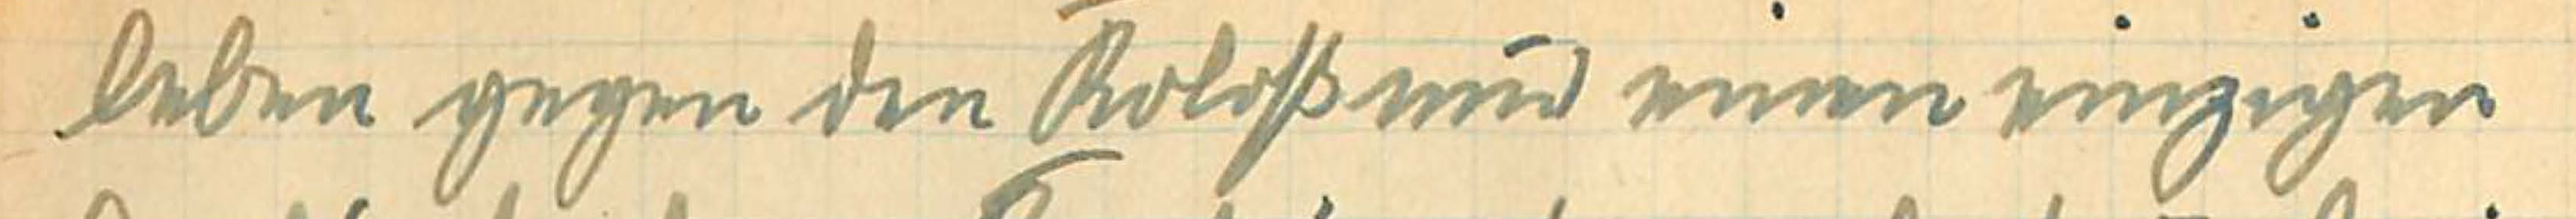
leben gegen den Koloß nur einen einzigen
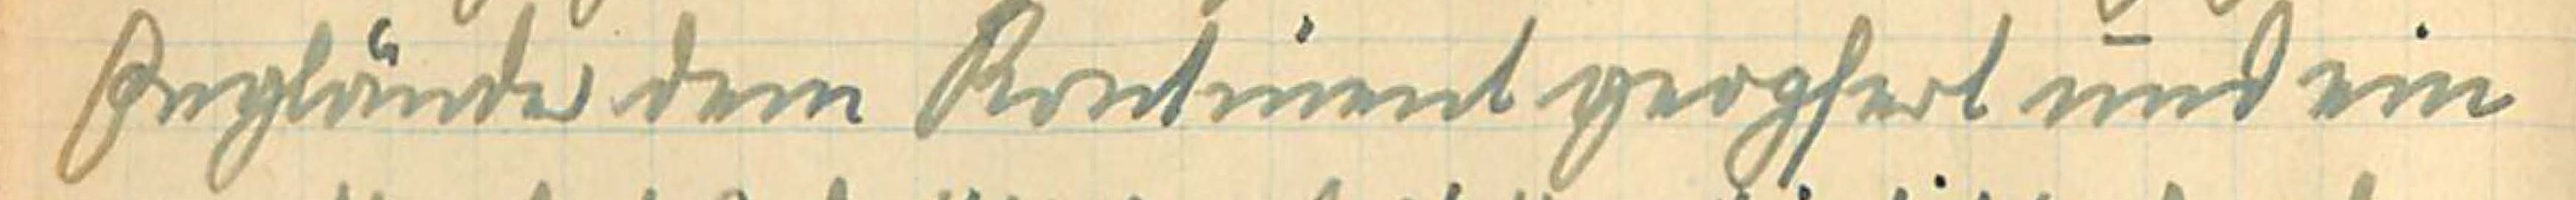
Engländer dem Kontinent geopfert und ein
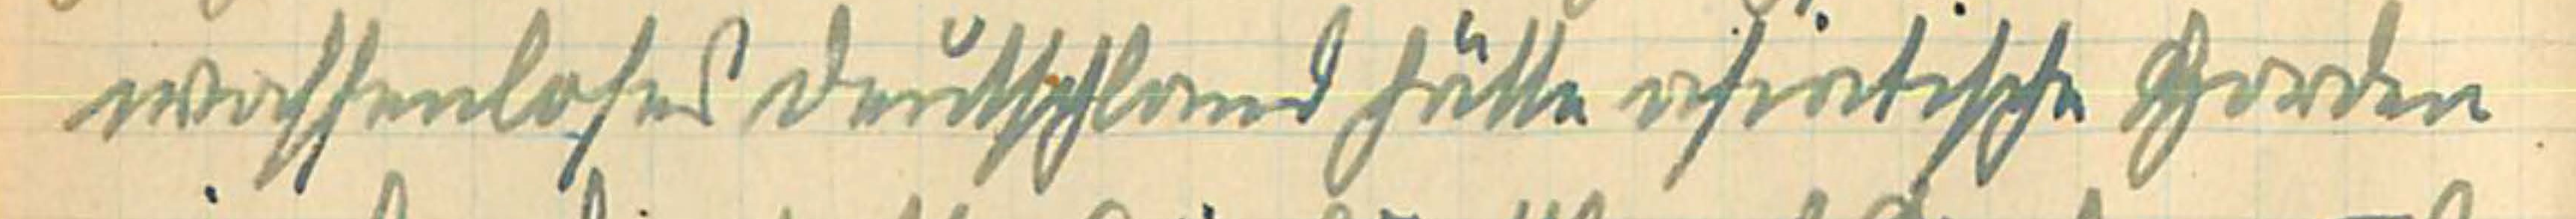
waffenloses Deutschland hätte asiatische Horden
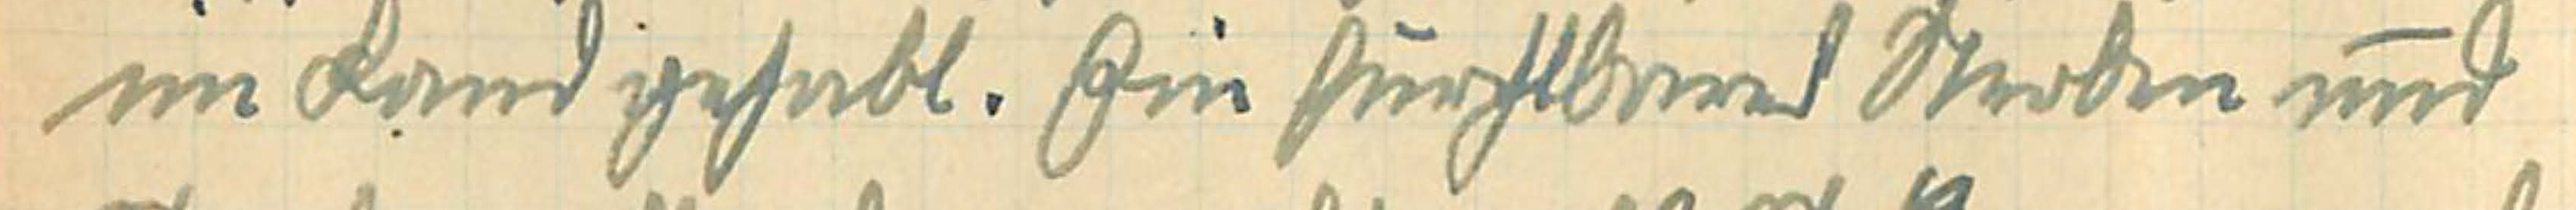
im Land gehabt. Ein furchtbares Sterben und
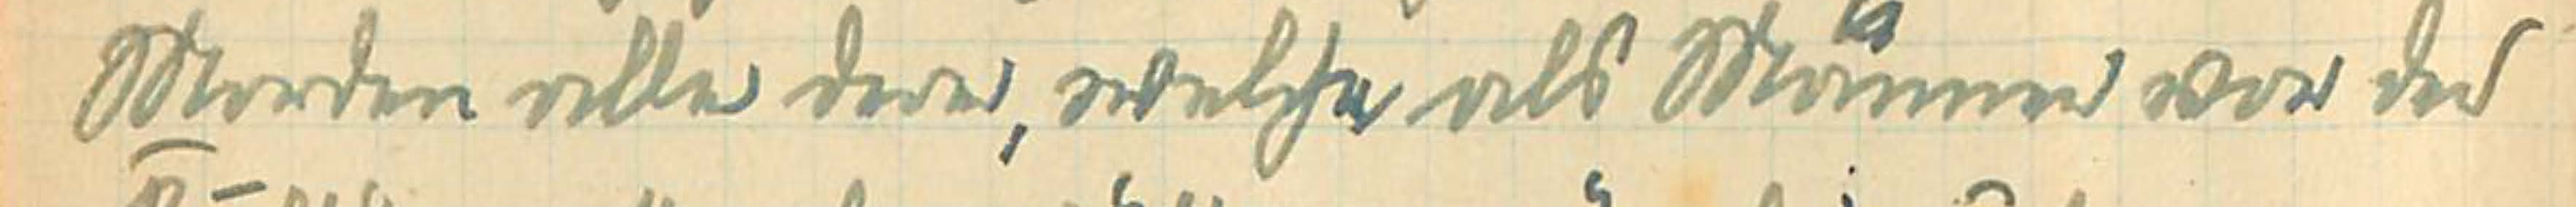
Morden aller derer, welche als Männer vor der
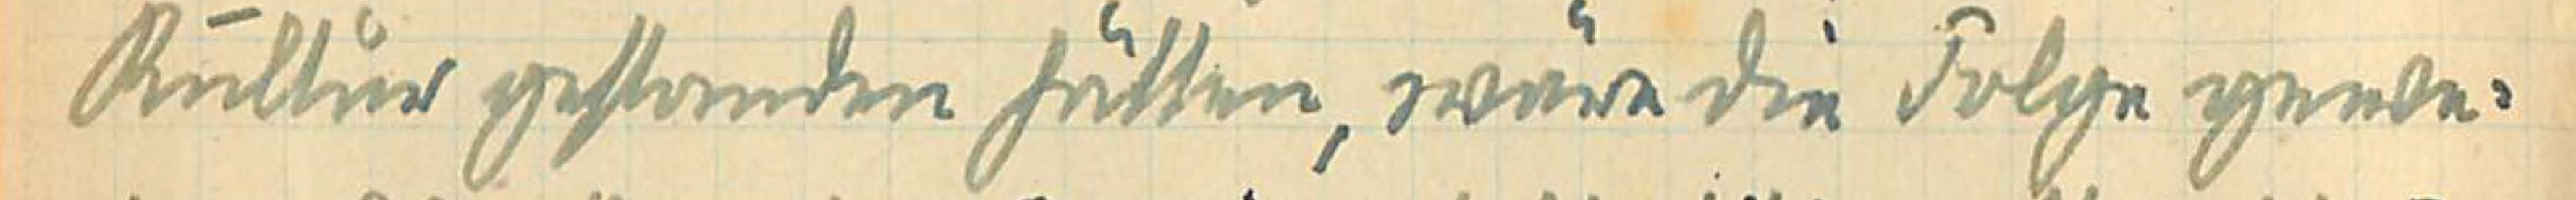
Kultur gestanden hätten, wäre die Folge gewe-
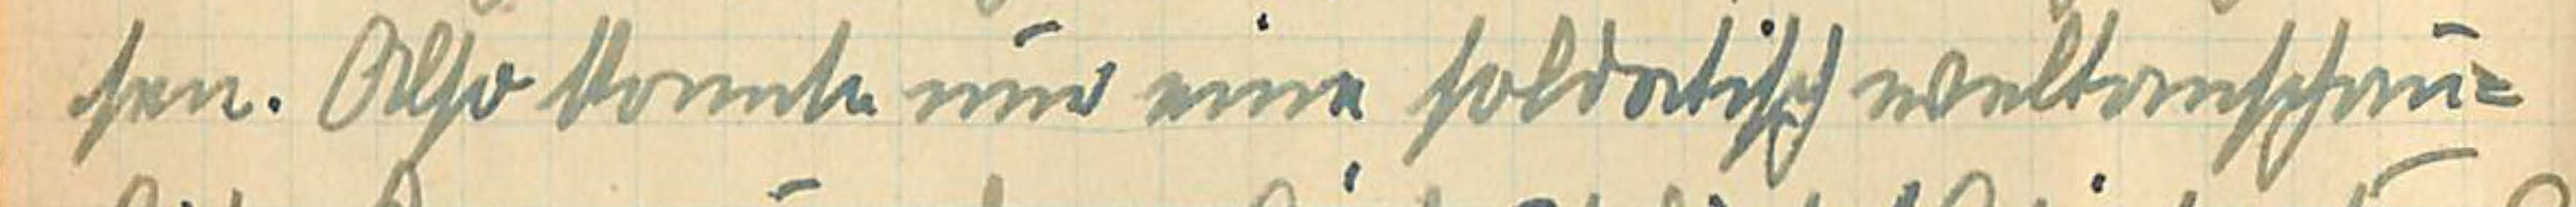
sen. Also konnte nur eine soldatisch weltanschau-
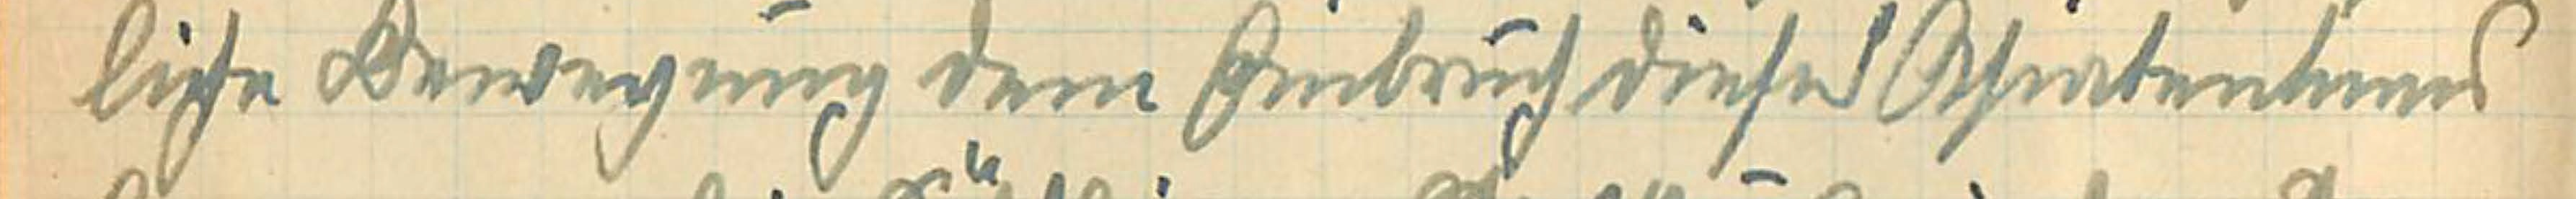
liche Bewegung dem Einbruch dieses Asiatentums
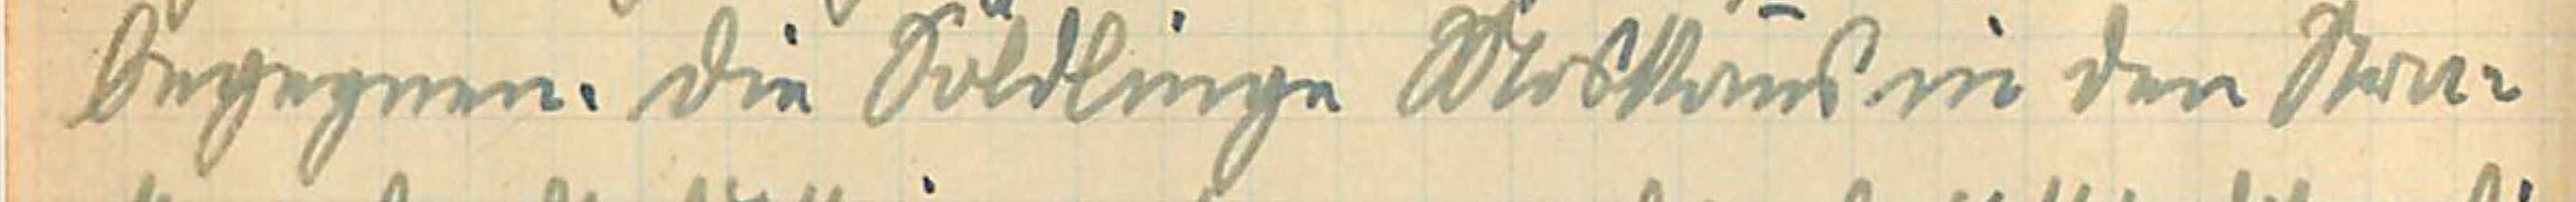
begegnen. Die Söldlinge Moskaus in den Stra-
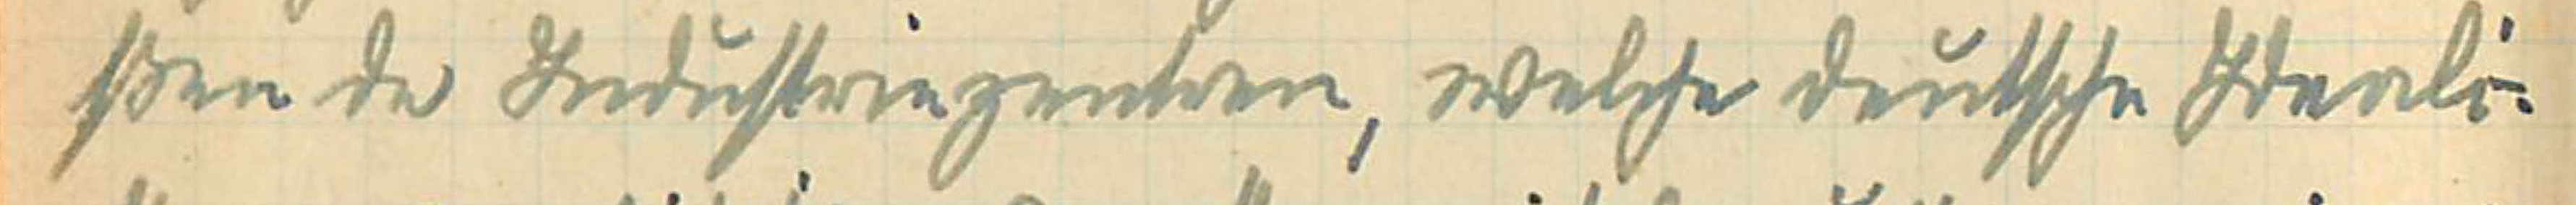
ßen der Industriezentren, welche deutsche Ideali-
